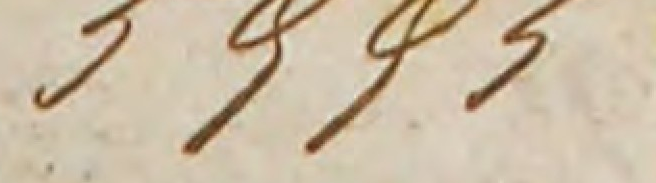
5995
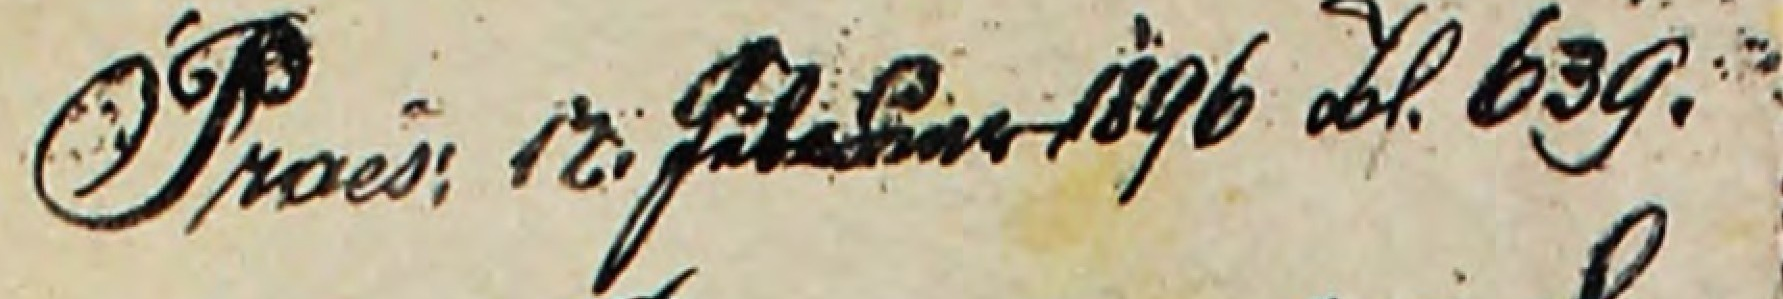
Praes: 12. Februar - 1896 Bl 639.
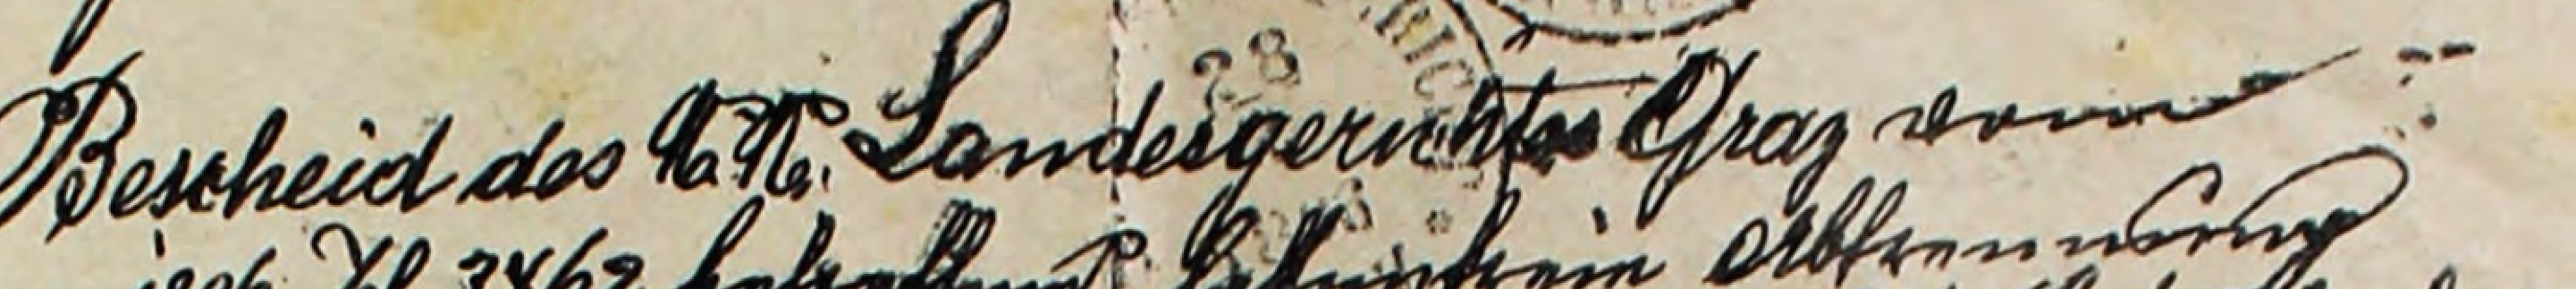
Bescheid des kk. Landesgerechtes Graz vom
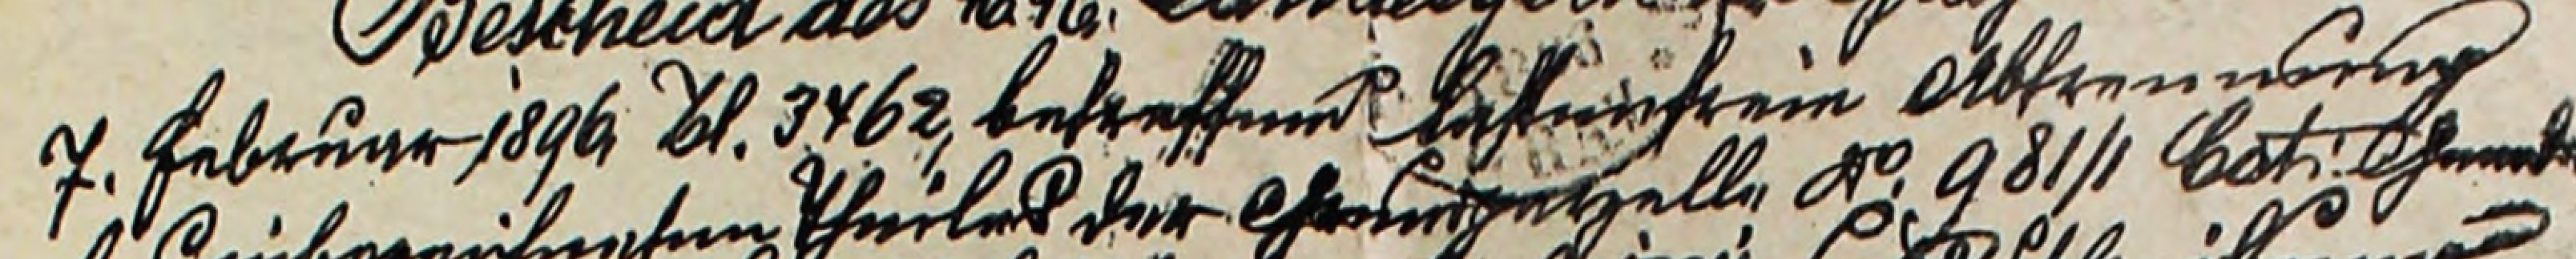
7. Februar 1896 Bl. 3462, betreffend lastenfreie Abtrennung
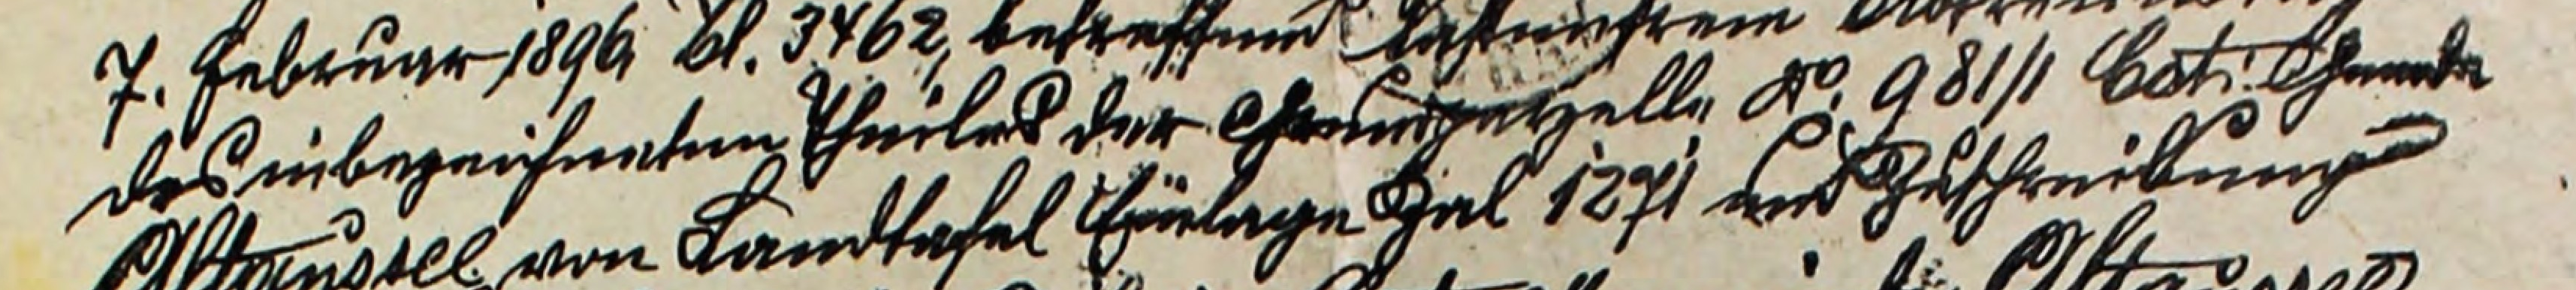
des inbezeichneten Theiles der Grundparzelle No 981/1 Cat. Gende
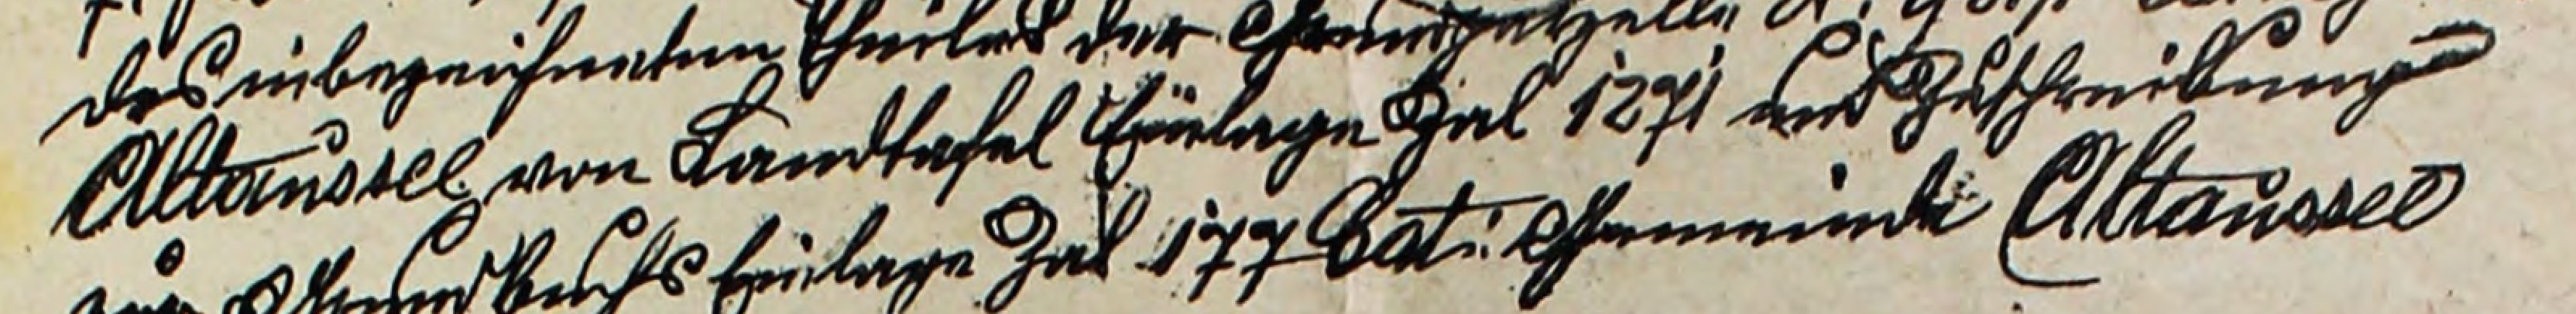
Altaussee von Landtafel Einlage Zal 1271 und Zuschreibung
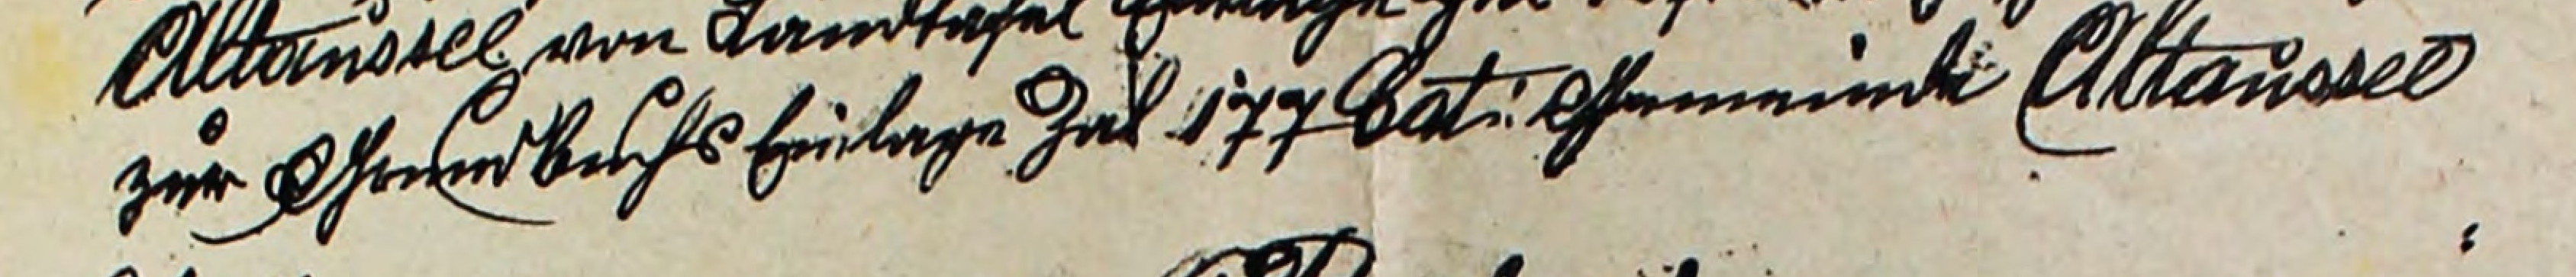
zur Grundbuchs Einlage Zal 177 Cat: Gemeinde Altaussee
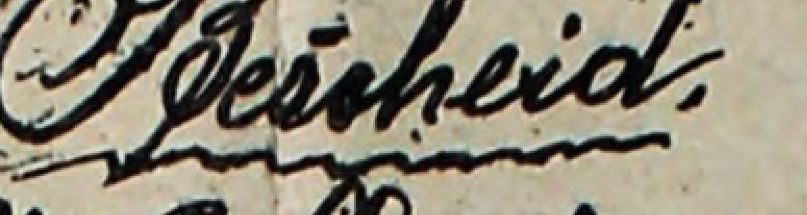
Bescheid.
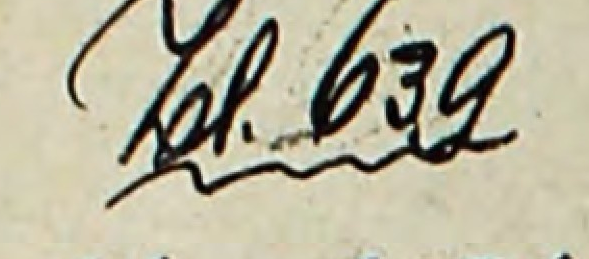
Bl. 639
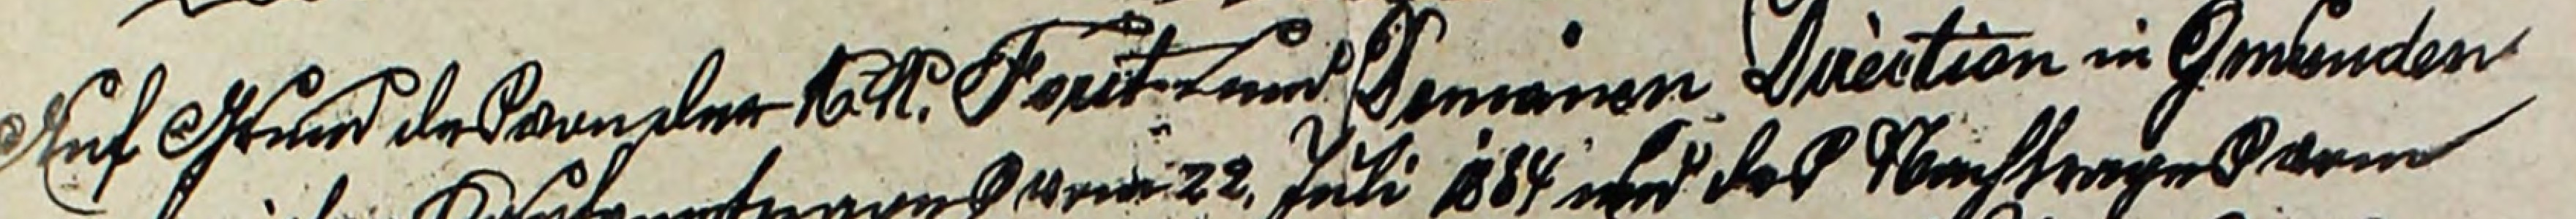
Auf Grund des von der kk. Forst und Domänen Direction in Gmunden
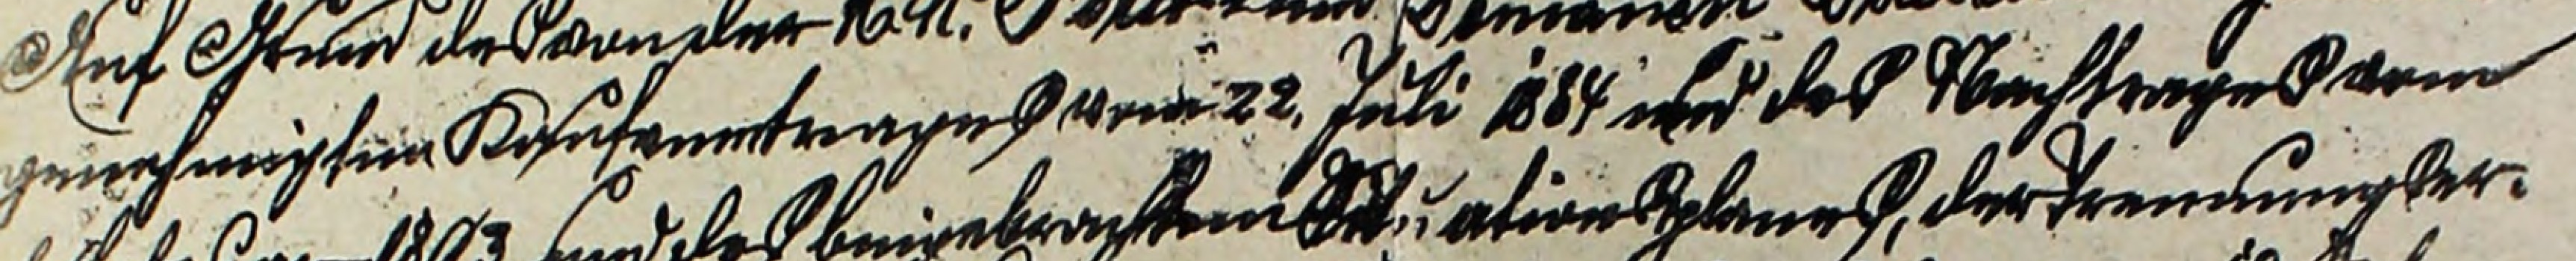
genehmigten Kaufvertrages vom 22. Juli 1884 und des Nachtrages vom
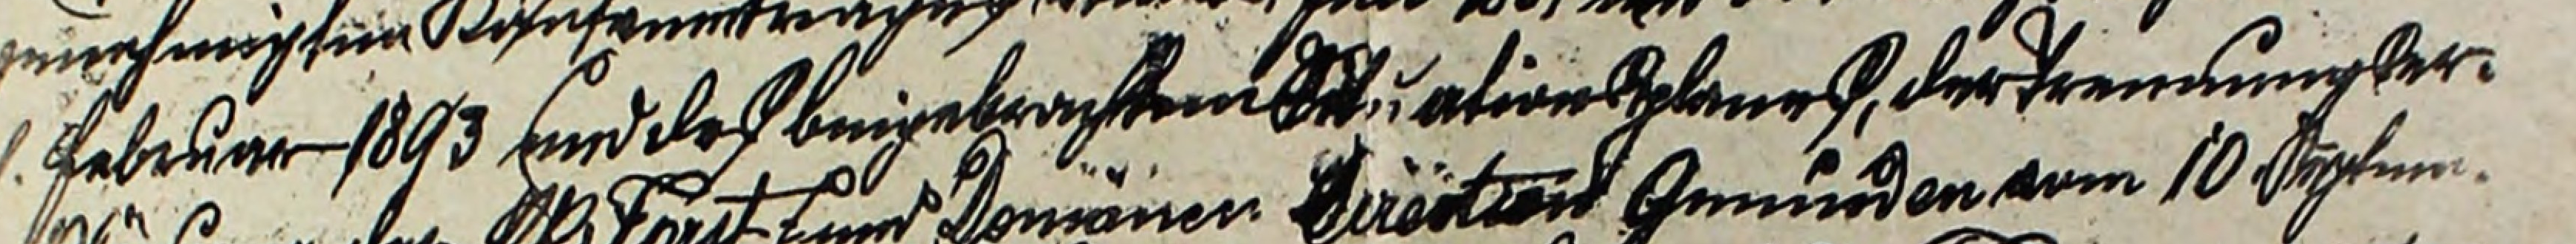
1. Februar 1893 und des beigebrachten Situationsplanes, der Trennungser„
